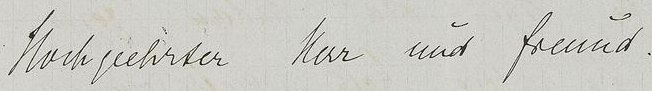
Hochgeehrter Herr und Freund.
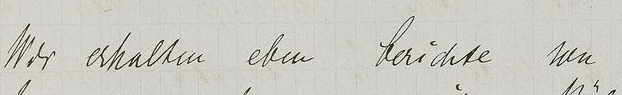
Wir erhalten eben Berichte von
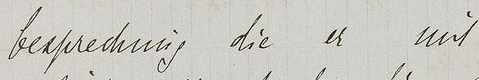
Besprechung die er mit
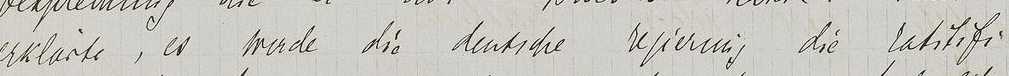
erklärte, es werde die deutsche Regierung die Ratifi-
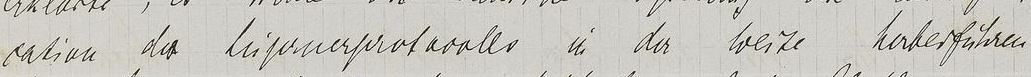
cation des Luzerner Protocolls in der Weise herbeiführen,
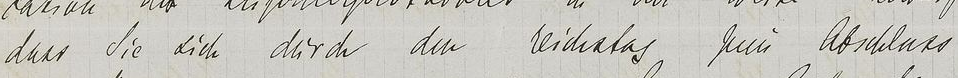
dass sie sich durch den Reichstag zum Abschluss
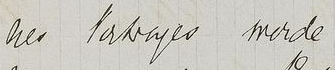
nes Vertrages werde
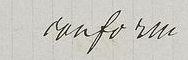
den früheren
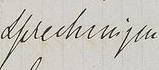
sprechungen nicht
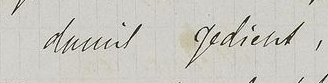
damit gedient,
